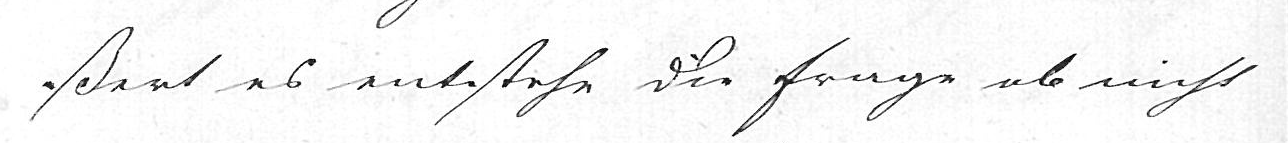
ßert es entstehe die Frage ob nicht
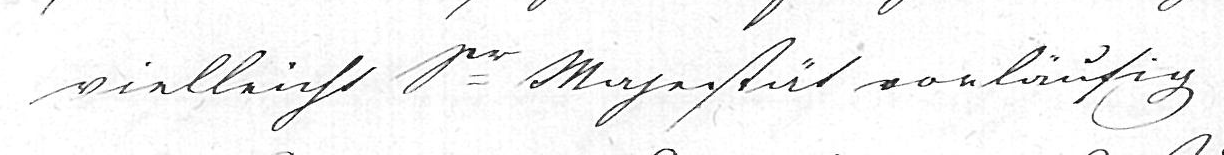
vielleicht Sr Majestät vorläufig
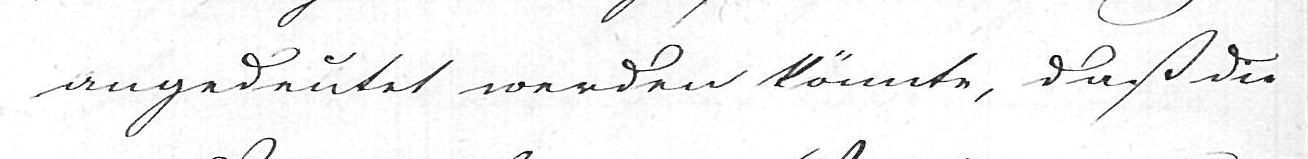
angedeutet werden könnte, daß die
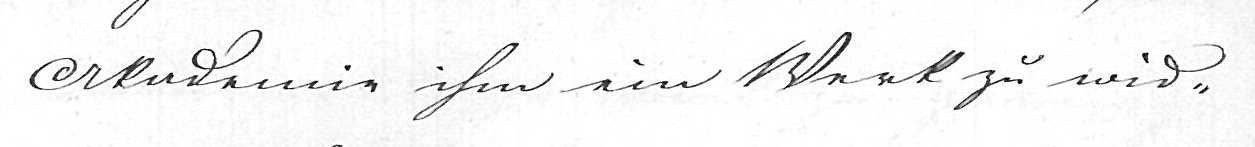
Akademie ihm ein Werk zu wid-
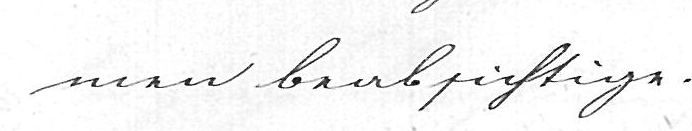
men beabsichtige.
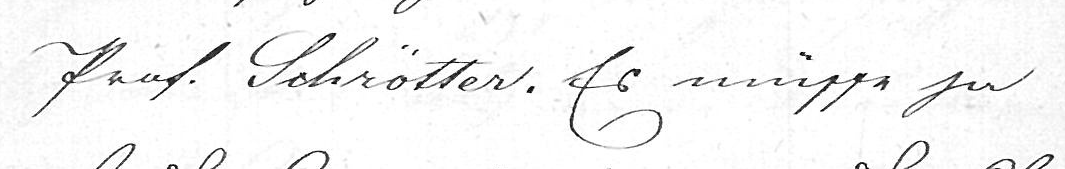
Prof. Schrötter. Es müsse ja
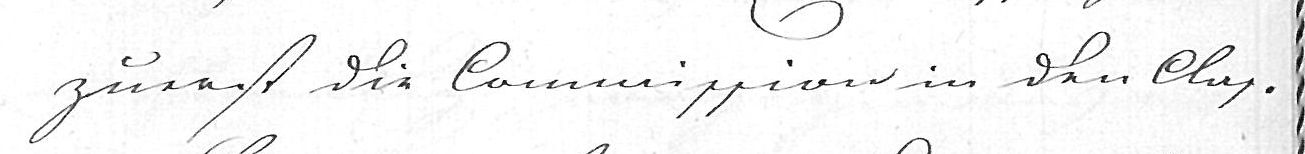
zuerst die Commission in den Clas-
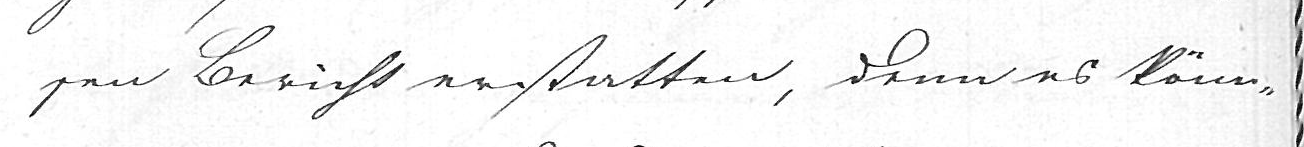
sen Bericht erstatten, denn es könn-
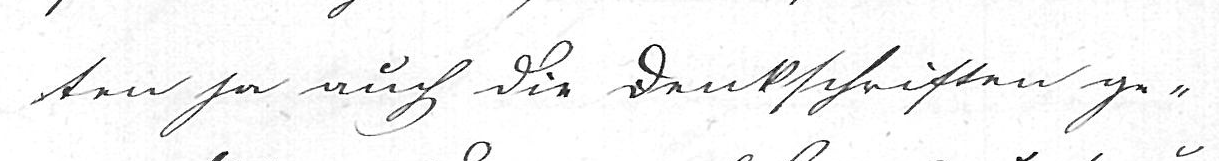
ten ja auch die Denkschriften ge-
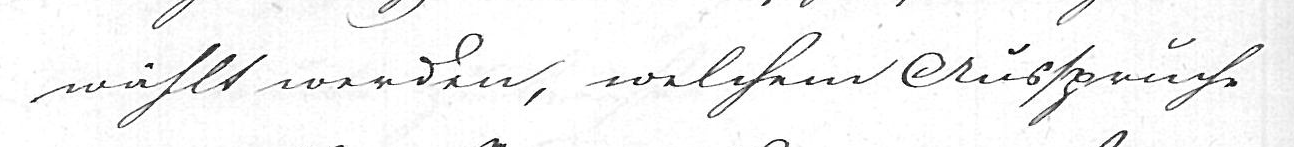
wählt werden, welchem Anspruche
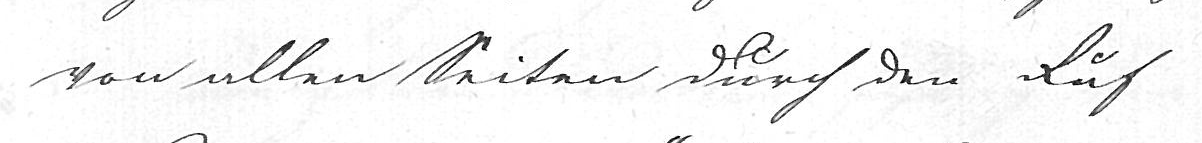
von allen Seiten durch den Ruf
